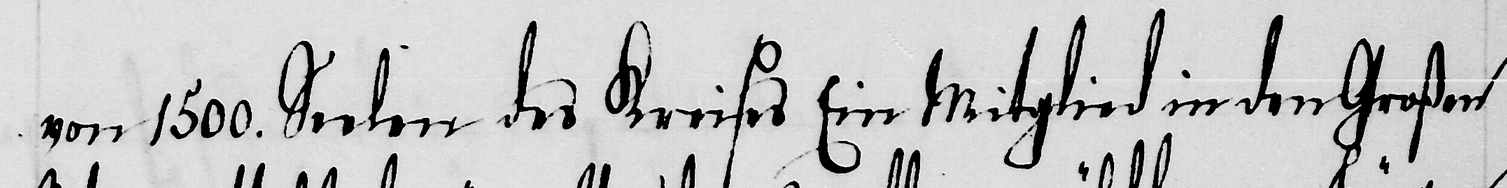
von 1500. Seelen des Kreises Ein Mitglied in den Großen
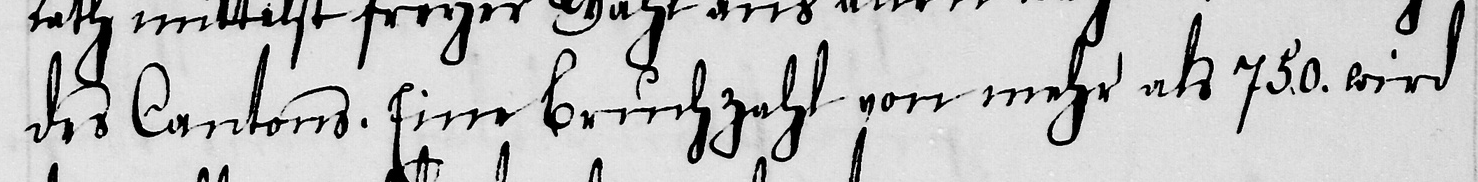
des Cantons. Eine Bruchzahl von mehr als 750. wird
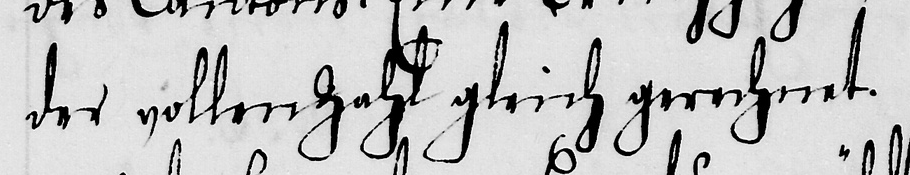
der vollen Zahl gleich gerechnet.
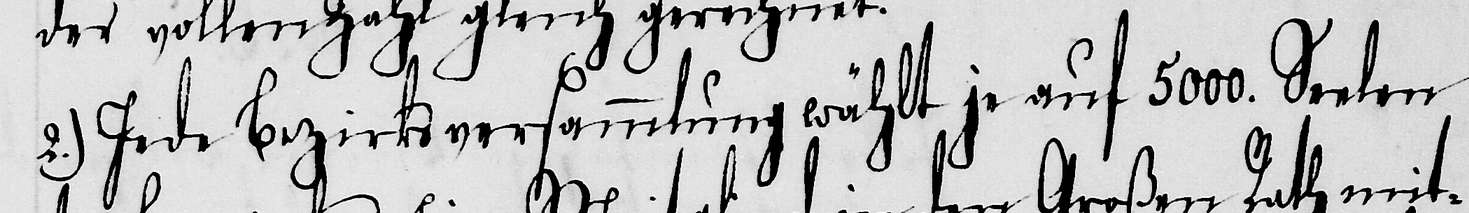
2.) Jede Bezirksversammlung wählt je auf 5000. Seelen
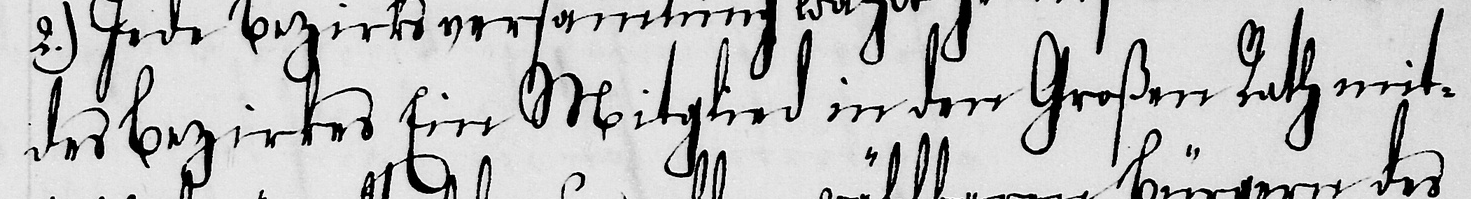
des Bezirkes Ein Mitglied in den Großen Rath mit¬
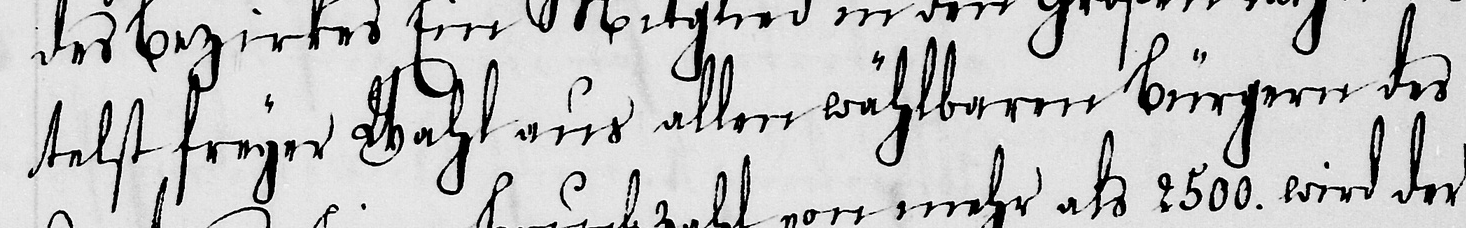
telst freyer Wahl aus allen wählbaren Bürgern des
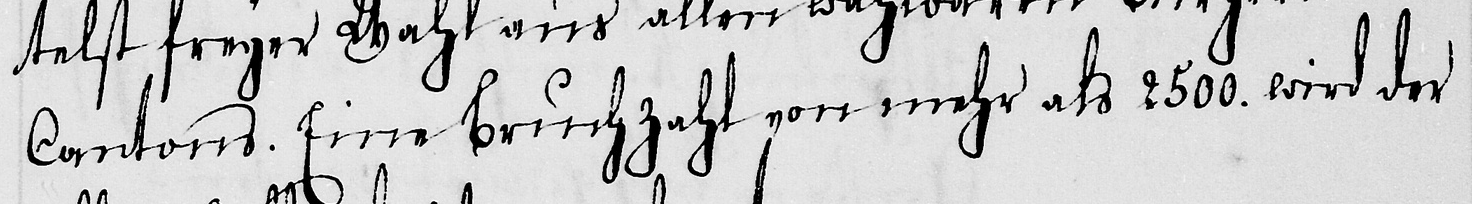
Cantons. Eine Bruchzahl von mehr als 2500. wird der
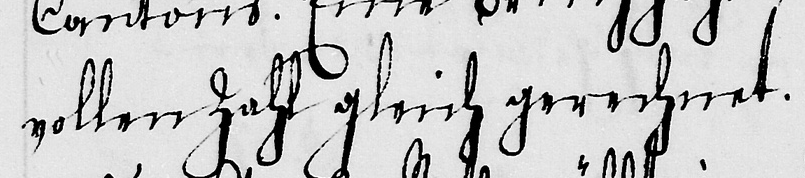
vollen Zahl gleich gerechnet.
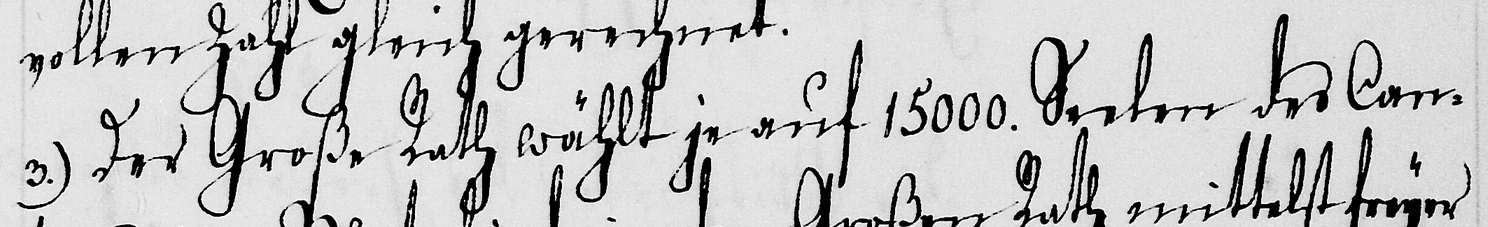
3.) Der Große Rath wählt je auf 15000. Seelen des Can¬
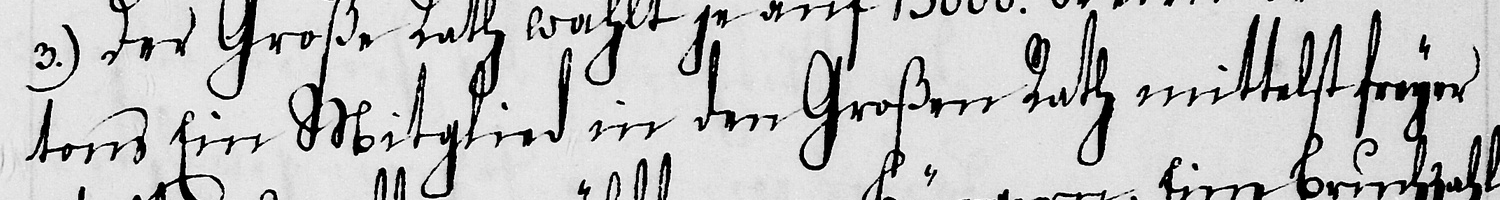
tons Ein Mitglied in den Großen Rath mittelst freyer
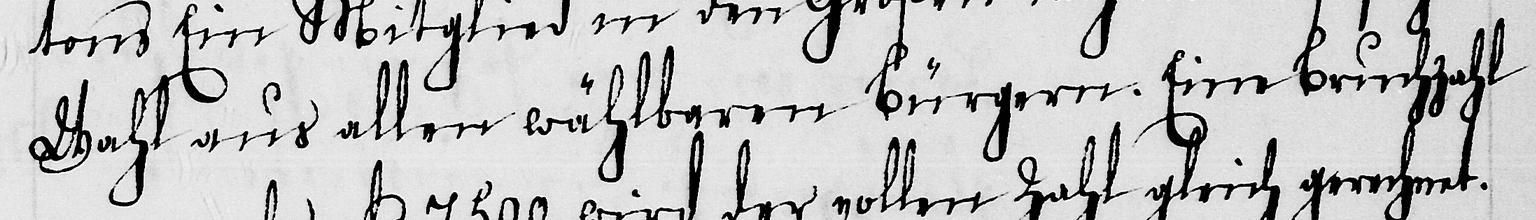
Wahl aus allen wählbaren Bürgern. Eine Bruchzahl
